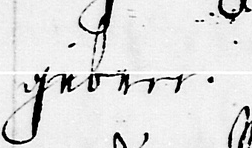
geben.
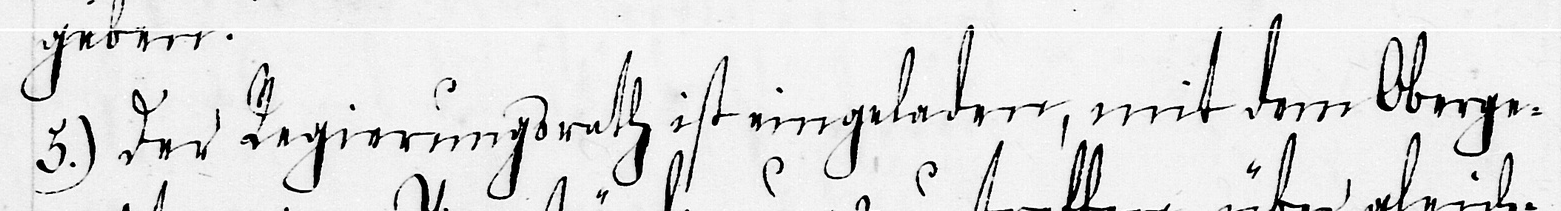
5.) Der Regierungsrath ist eingeladen, mit dem Oberge¬
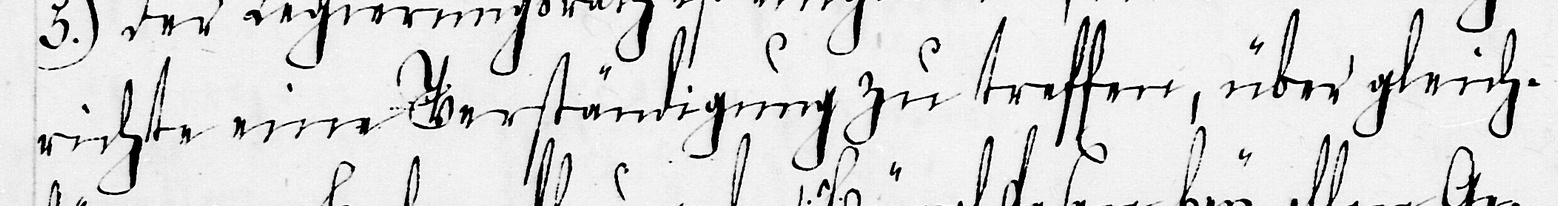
richte eine Verständigung zu treffen, über gleich¬
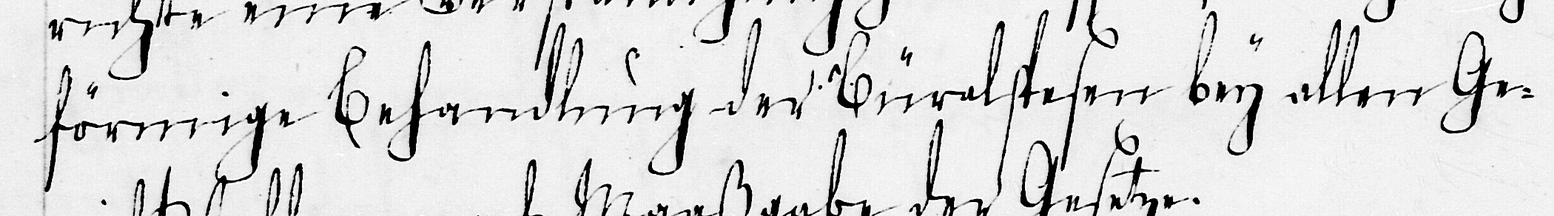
förmige Behandlung der Büralspesen bey allen Ge¬
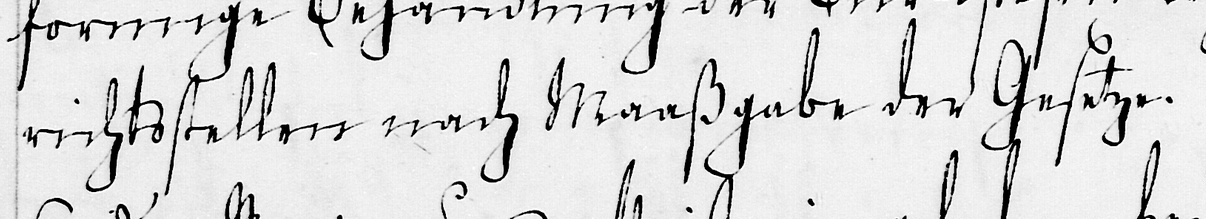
richtsstellen nach Maaßgabe der Gesetze.
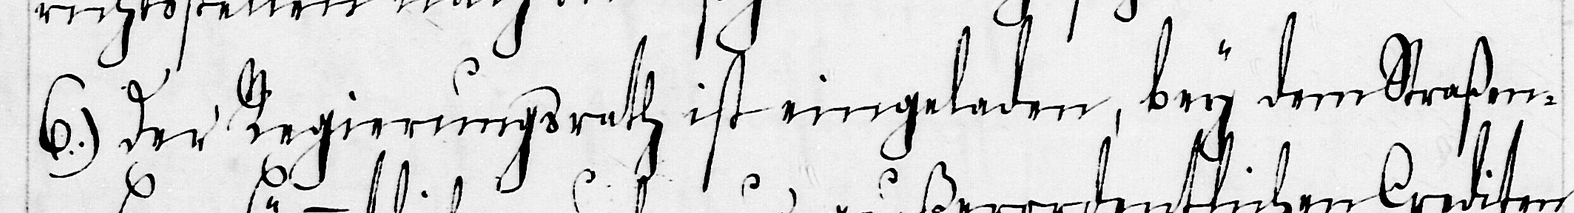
6.) Der Regierungsrath ist eingeladen, bey dem Straßen¬
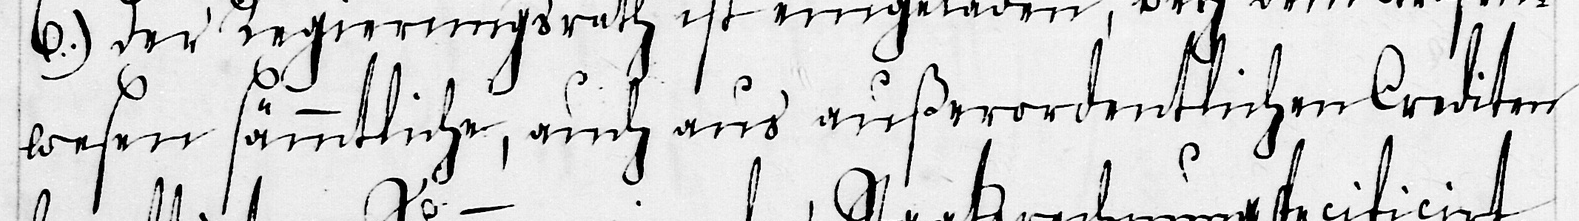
wesen sämmtliche, auch aus außerordentlichen Crediten
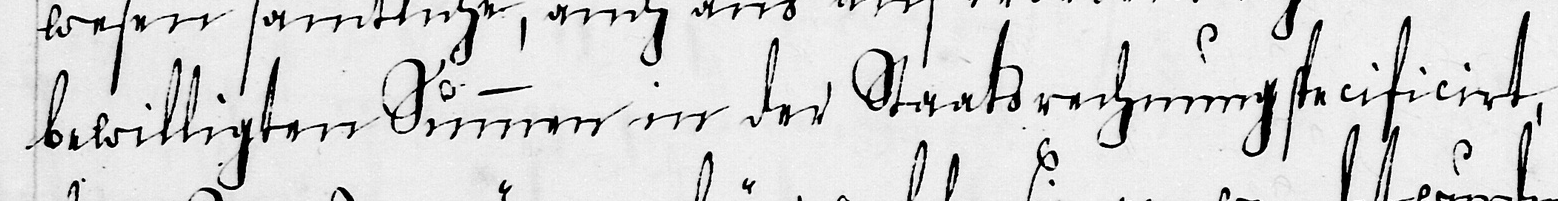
bewilligten Summen in der Staatsrechnung specificirt,
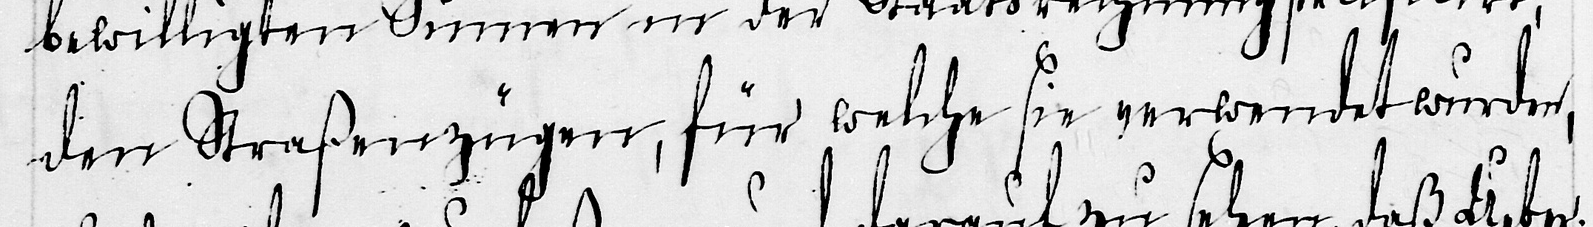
den Straßenzügen, für welche sie verwendet wurden,
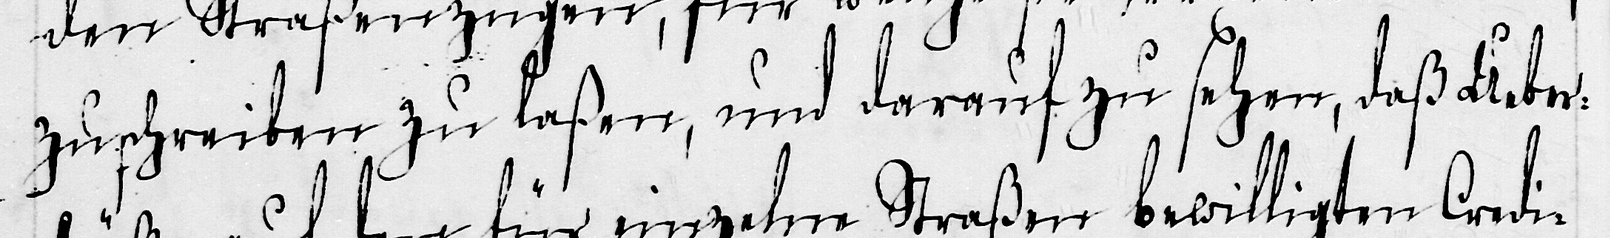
zuschreiben zu laßen, und darauf zu sehen, daß Ueber¬
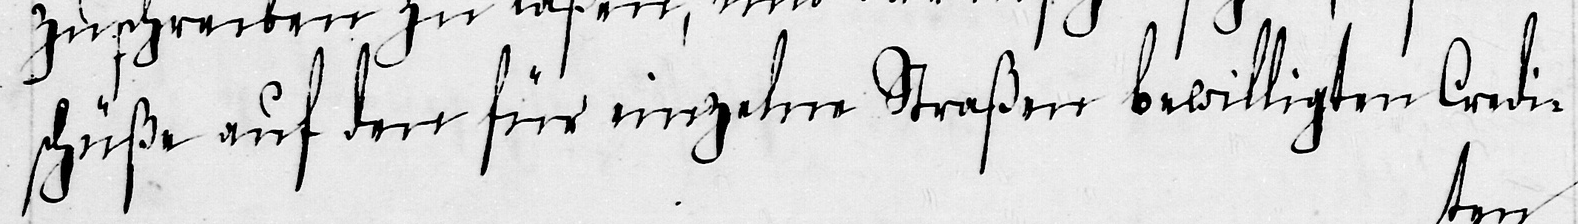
schüße auf den für einzelne Straßen bewilligten Credi-
